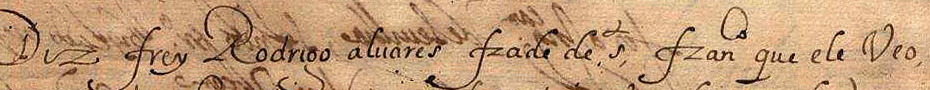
Diz frey Rodrigo aluares frade de sto. fran.co que elle Veo,
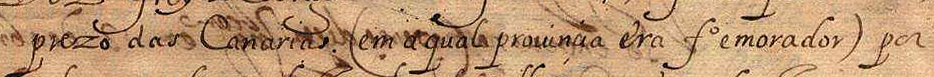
prezo das Canarias (em a qual prouincia era fo e morador) por
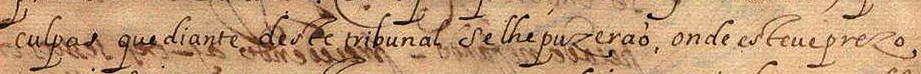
culpas que diante deste tribunal se lhe puzeraõ, onde esteue prezo
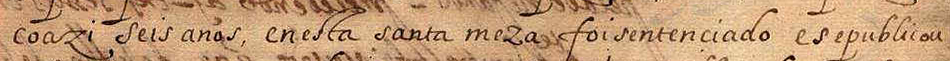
coazi seis anos, e nesta santa meza foi sentenciado e se publicou
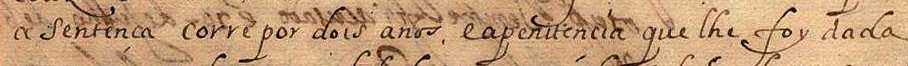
a sentença corre por dois anos, e a penitencia que lhe foy dada
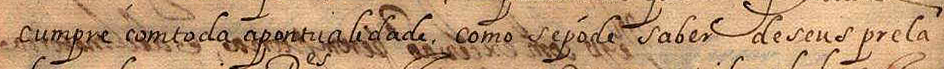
cumpre com toda a pontualidade como se pode saber de seus prela
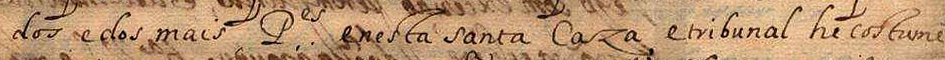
dos e dos mais P.es e nesta santa Caza e tribunal he costume
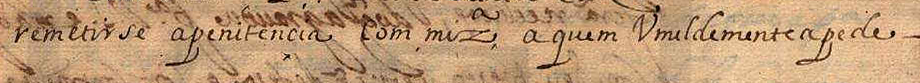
remetirse a penitencia com miza a quem Vmildemente a pede
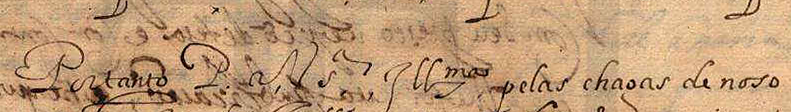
Portanto P. a V sa Jllsma pelas chagas de noso
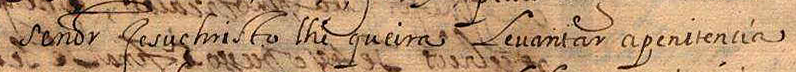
senōr Jesu christo lhe queira Leuantar a penitencia
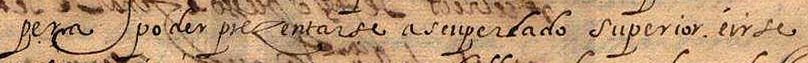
pera poder preZentarse a seu perlado superior e irse
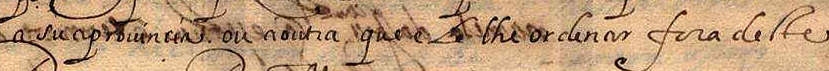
a sua prouincia ou a outra que eLe lhe ordenar fora deste
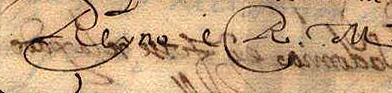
Reyno e R. M.
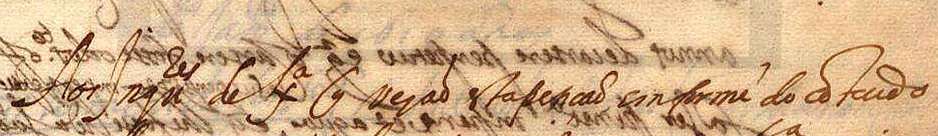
Aos Jnqures de Lxa q̄ vejaõ esta petiçaõ E informē do cōteudo
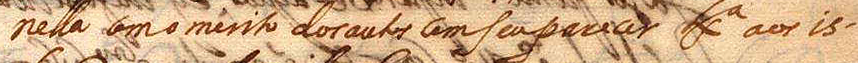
nella com o merito dos autos com seu parecer Lxa aos i5.
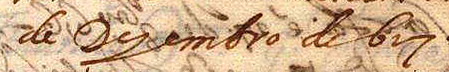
de Dezembro de 617.
